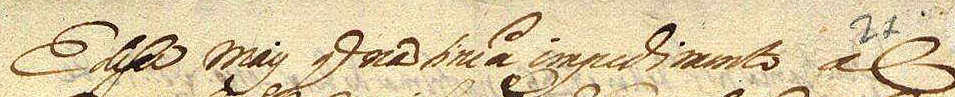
E disse mais q̄ naõ tinha impedimento al
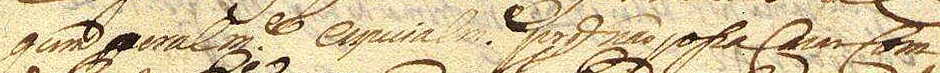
gum geralm.e especialm.e porq̄ naõ possa Cazar Com
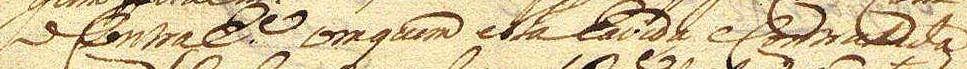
o Contra h.e com quem esta havida e Contratada
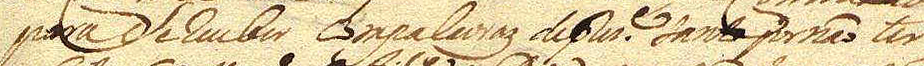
para se Receber com palavraz de prez.te tanto por naõ ter
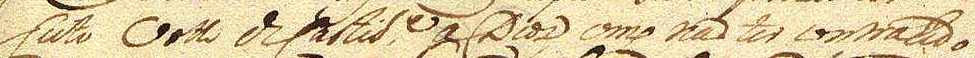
feito votto de Castid.e a Deoz como naõ ter contrahido
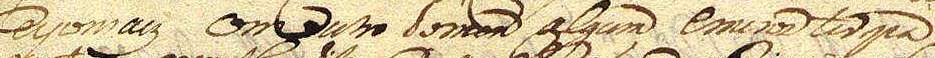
esponsaez com outro homem algum, e menoz ter pa
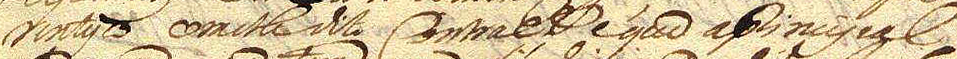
rentesco com elle dito Contrahe e que a principal
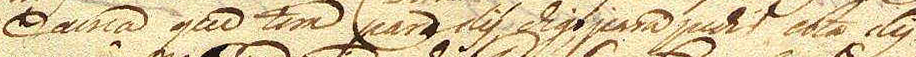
causa que tem para dis digo para pedir esta dis
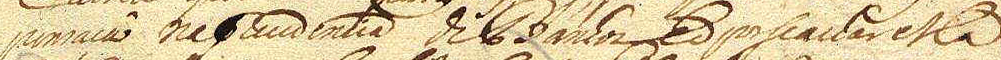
pensaçaõ na precedencia de Banhoz he por se achar ella
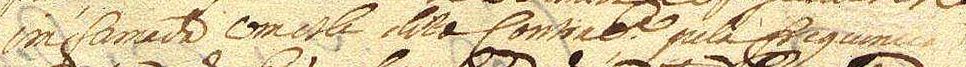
imfamada com elle dito Contrah;e pela frequencia
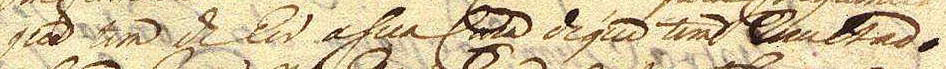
que tem de hir a sua Caza de que tem Rezultado
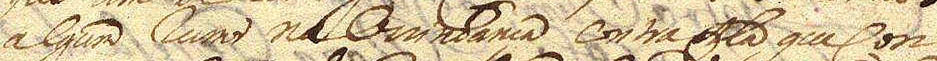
algum Rumor na Vizinhança contra ella que Con
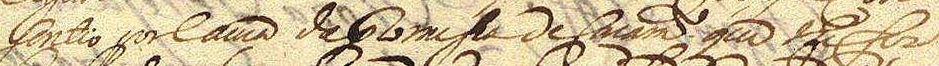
sentio por cauza da promessa de Cazamto. que lhe fez
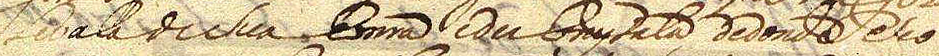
Levala de Sua honra e dezhonestala, de donde se o
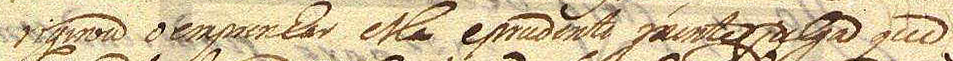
riginou o emprenhar ella e prudentemente julga que
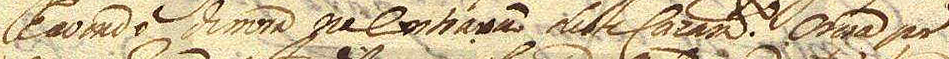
havendo demora na Contrasaõ deste Cazam.to overa por
